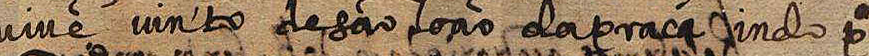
uiuē iunto de saõ Ioaõ da praça indo pa
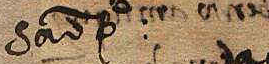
saõ po:
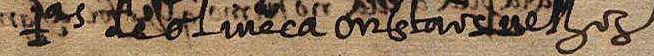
t.as de oliuēça cristaõs uelhos
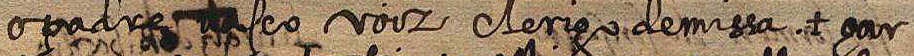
+ o padre uasco roiz̄ clerigo de missa. + gar
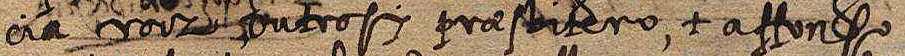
cia roiz, outrosy præsbitero, + affonso
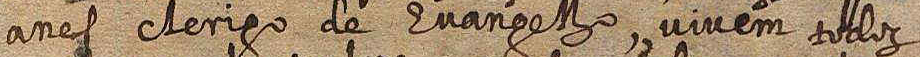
anes clerigo de Euangelho, uiuem todos
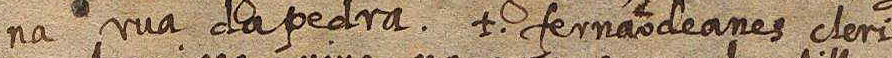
na rua da pedra. +. fernaõ de anes cleri
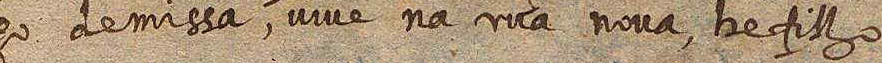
go de missa, uiue na rua noua, he filho
